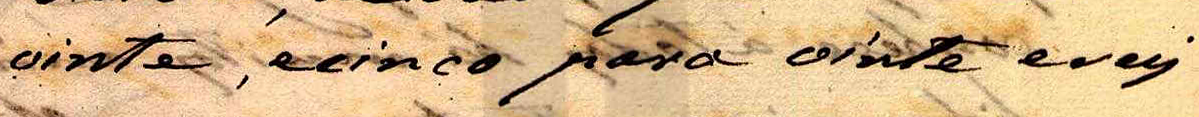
vinte, e cinco para vinte e seis
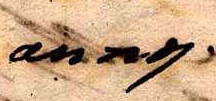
annos.
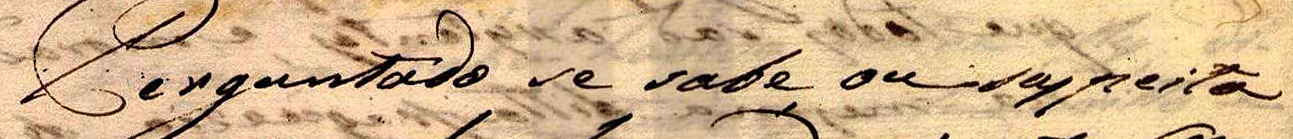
Perguntado se sabe ou suspeita
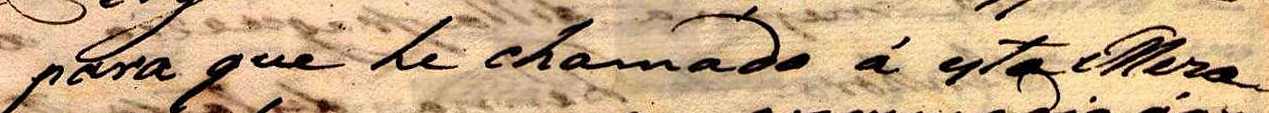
para que he chamado á esta Meza
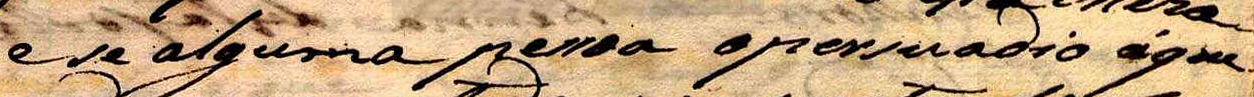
e se alguma pessoa o persuadio á que
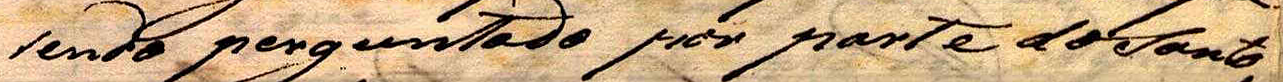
sendo perguntado por parte do Santo
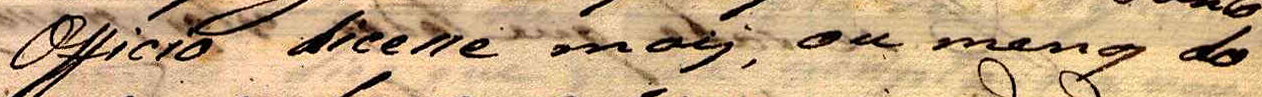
Officio dicesse mais, ou menos do
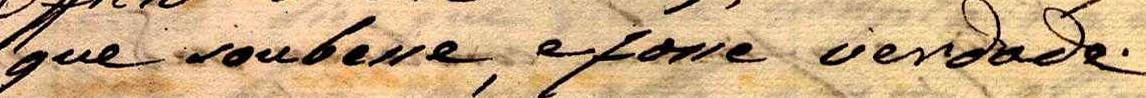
que soubesse, e fosse verdade.
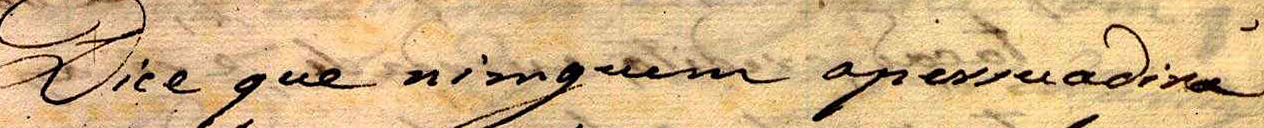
Dice que nimguem o persuadira
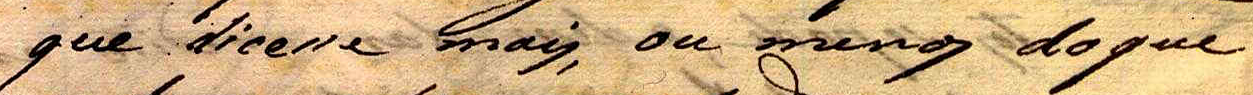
que dicesse mais, ou menos do que
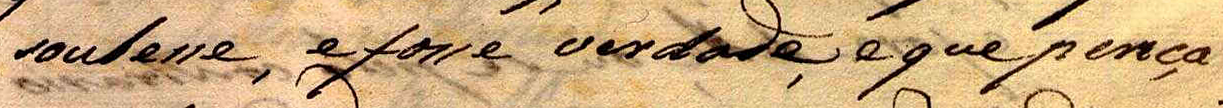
soubesse, e fosse verdade, e que pença
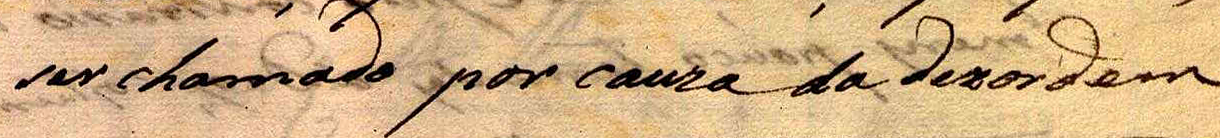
ser chamado por cauza da dezordem
